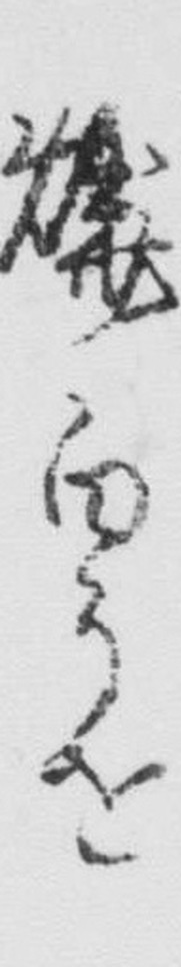焼白うを
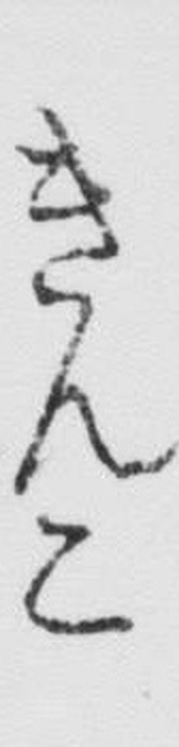きんこ
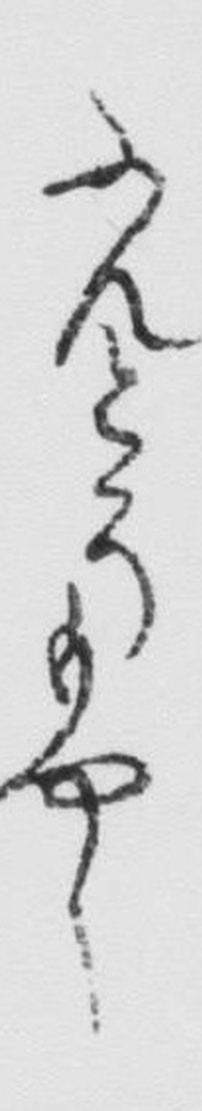ふんとうもやし
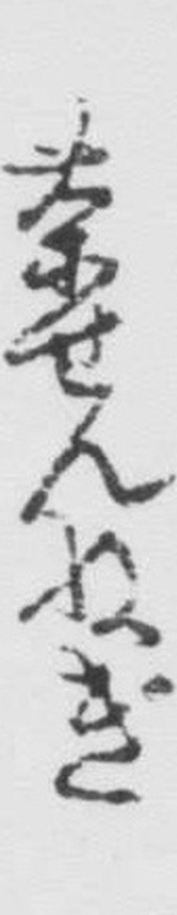茶せんねぎ
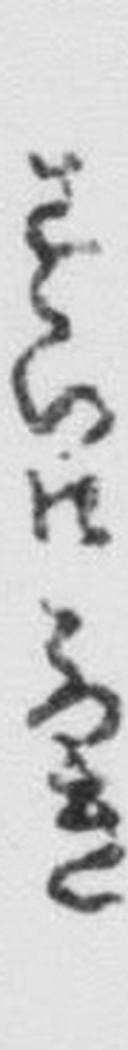すい口ふき
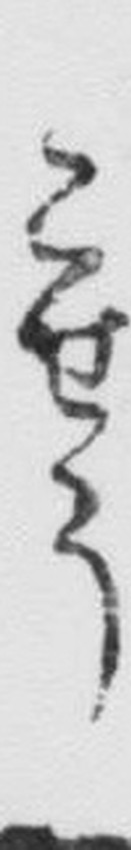こせう
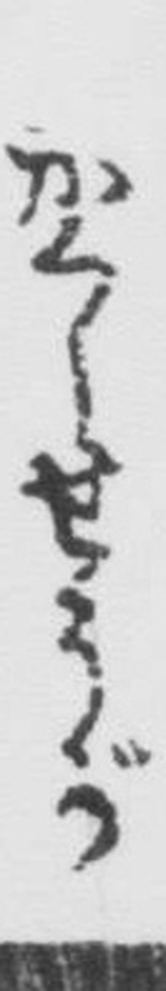かくしせうが
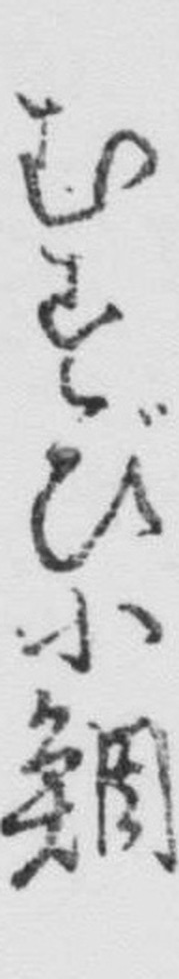むすび小鯛
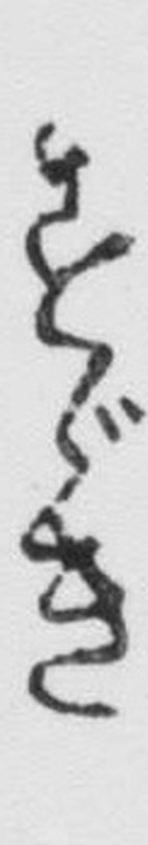すゞき
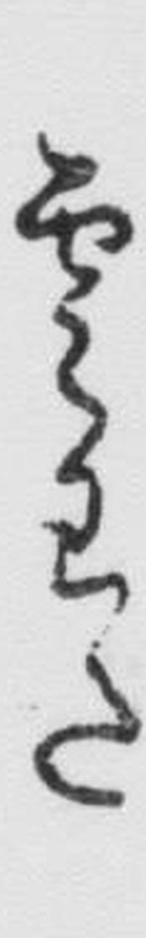雲わた
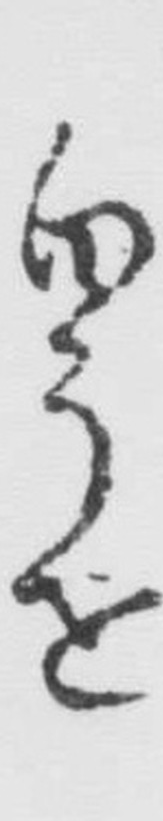白うを
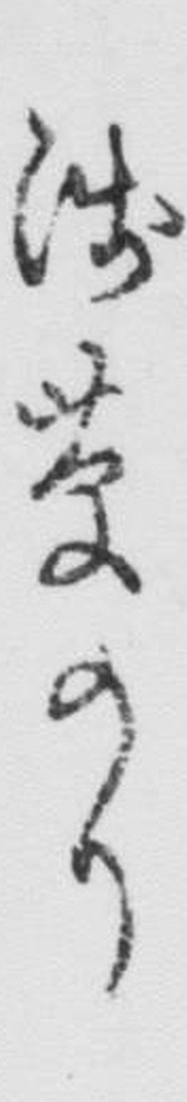浅草のり
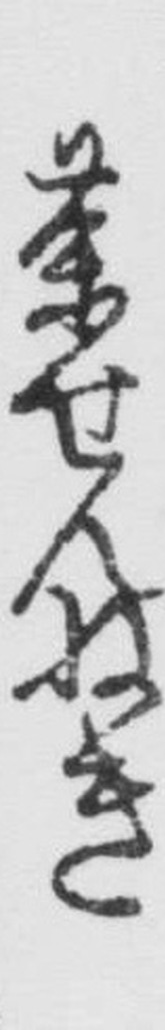茶せんねき
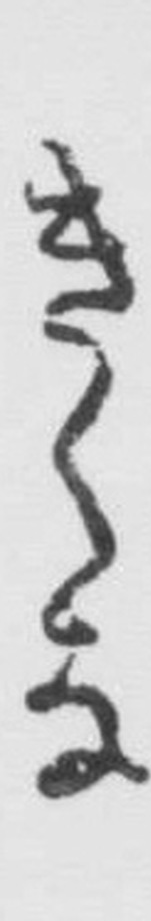きくな
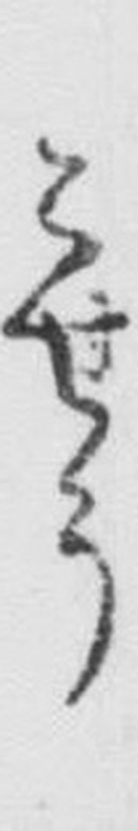こせう
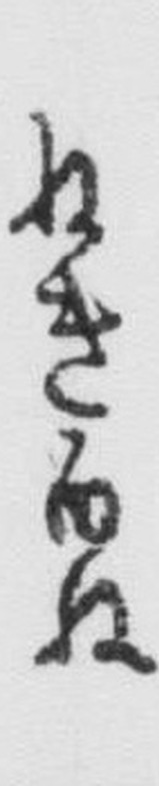ねき白ね
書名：諸家通用/即席料理
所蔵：大阪府立大学学術情報センター 国文学研究資料館
